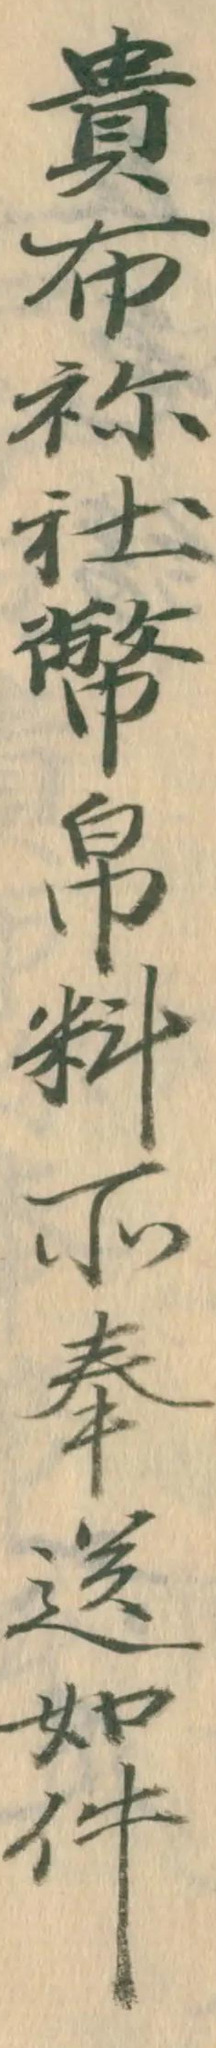貴布祢社幣帛料所奉送如件
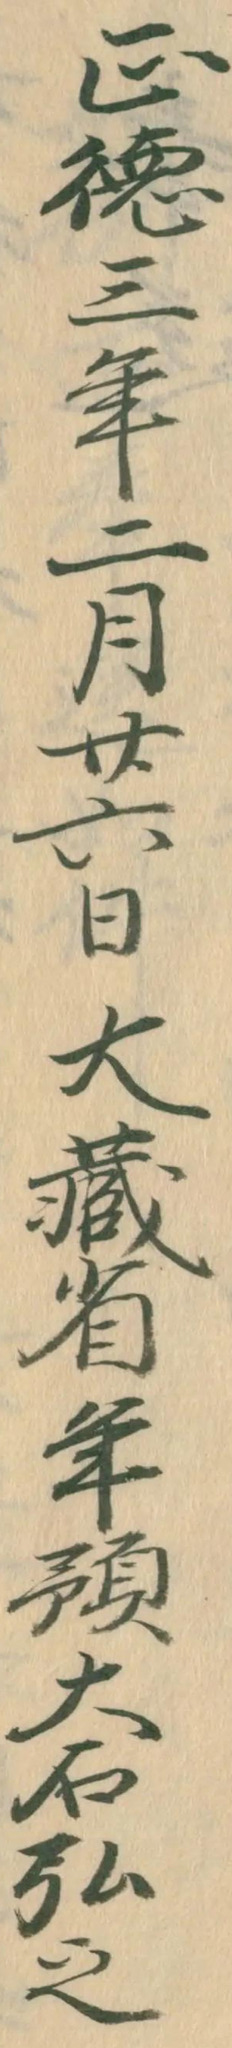正徳三年二月廿六日大蔵省年預大石弘之

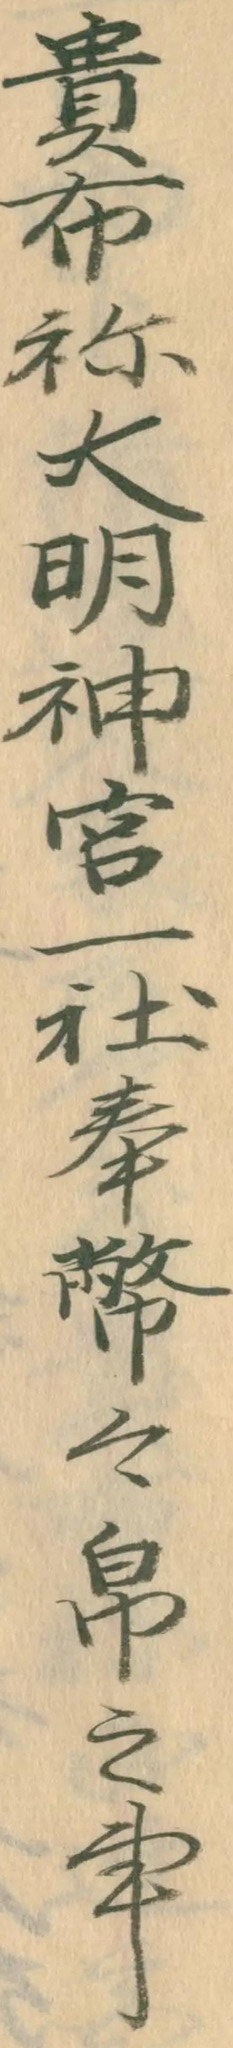貴布祢大明神宮一社奉幣々帛之事聞宴
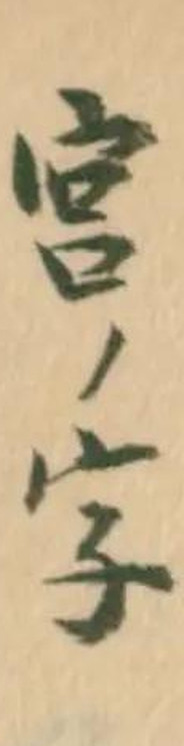宮ノ字
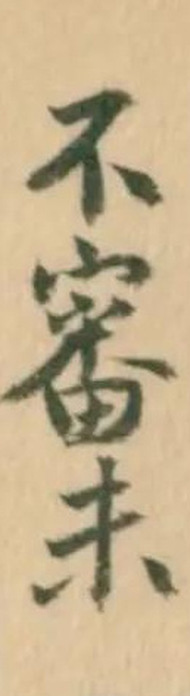不審未
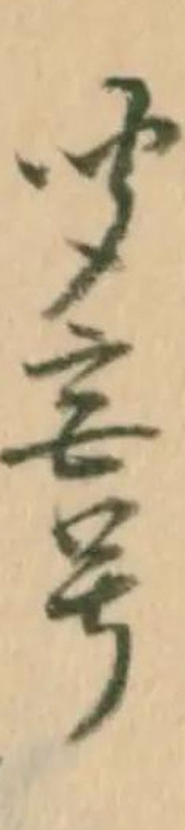聞宮号
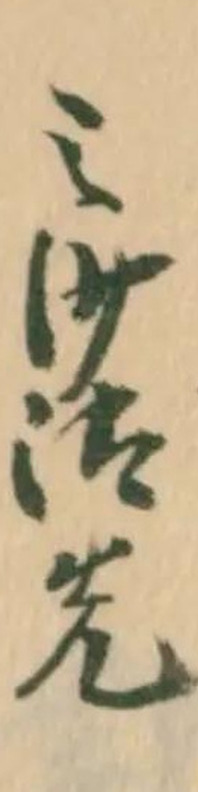之沙汰先
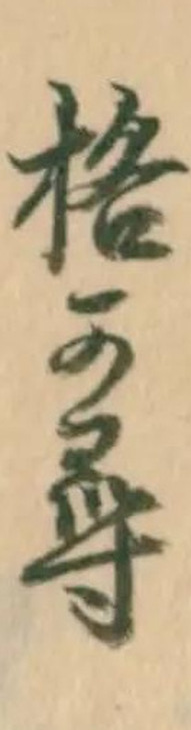格可尋
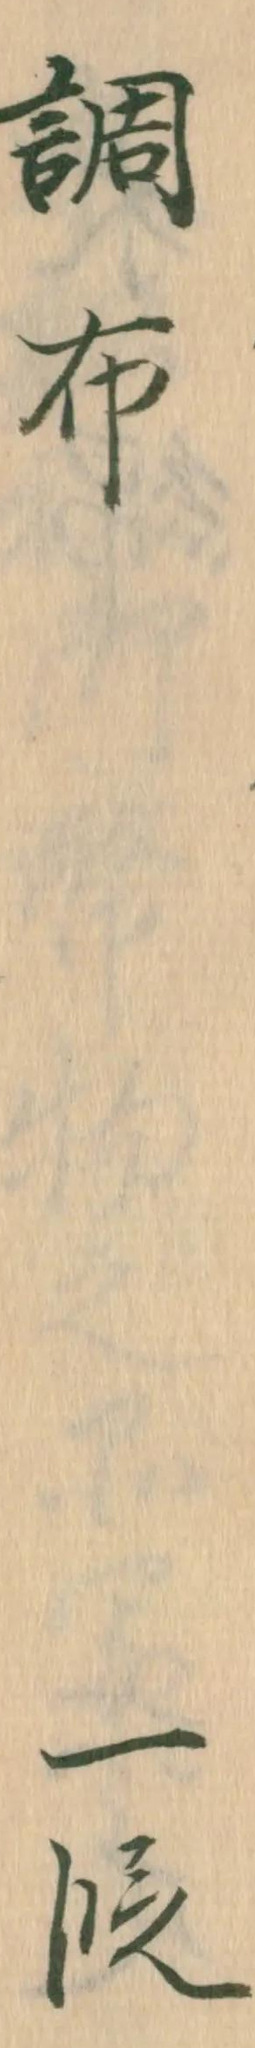調布一段
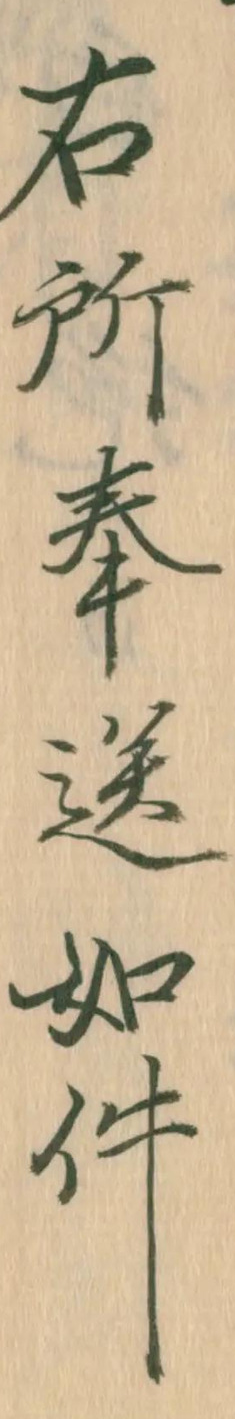右所奉送如件
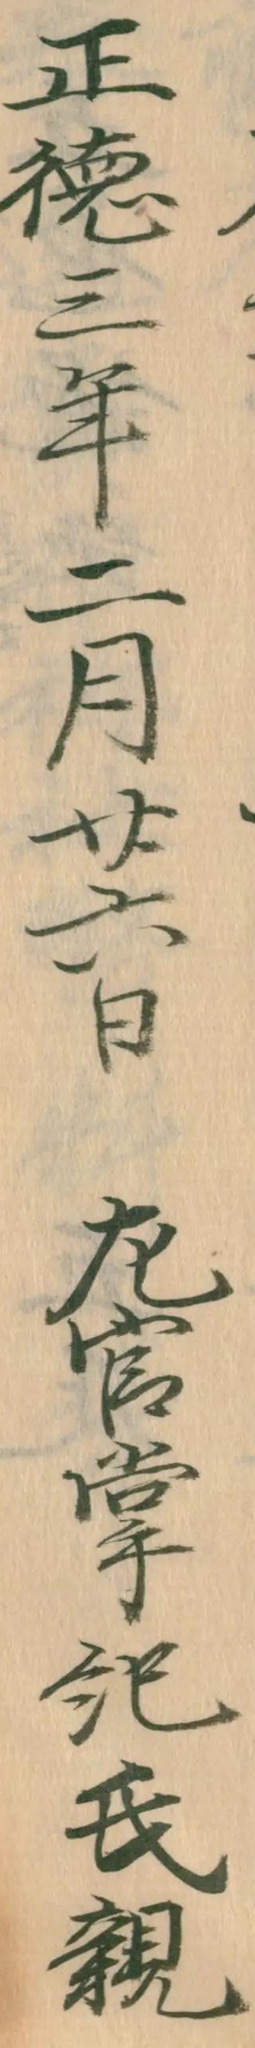正徳三年二月廿六日左官掌紀氏親
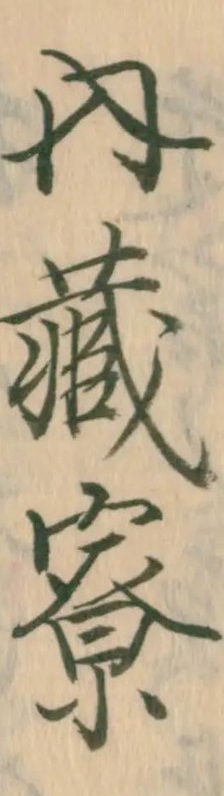内蔵寮
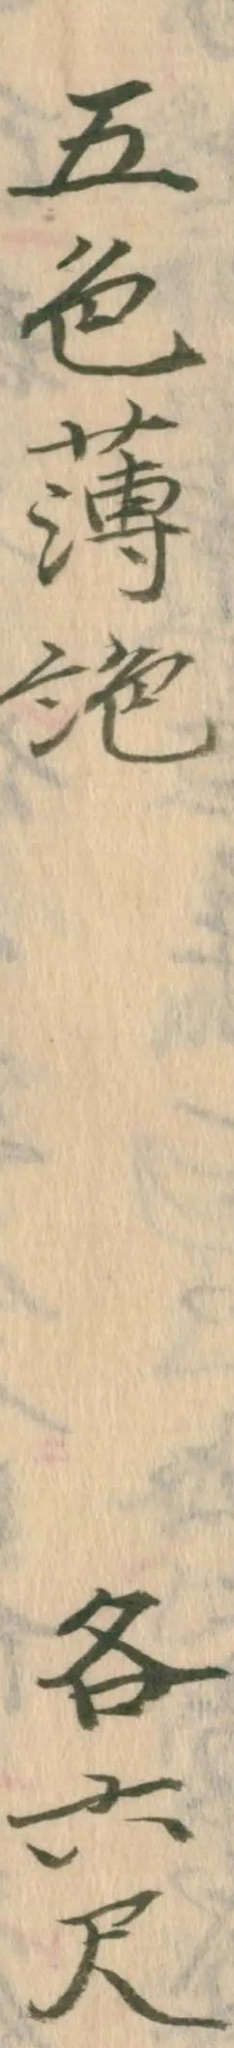五色薄絁各六尺
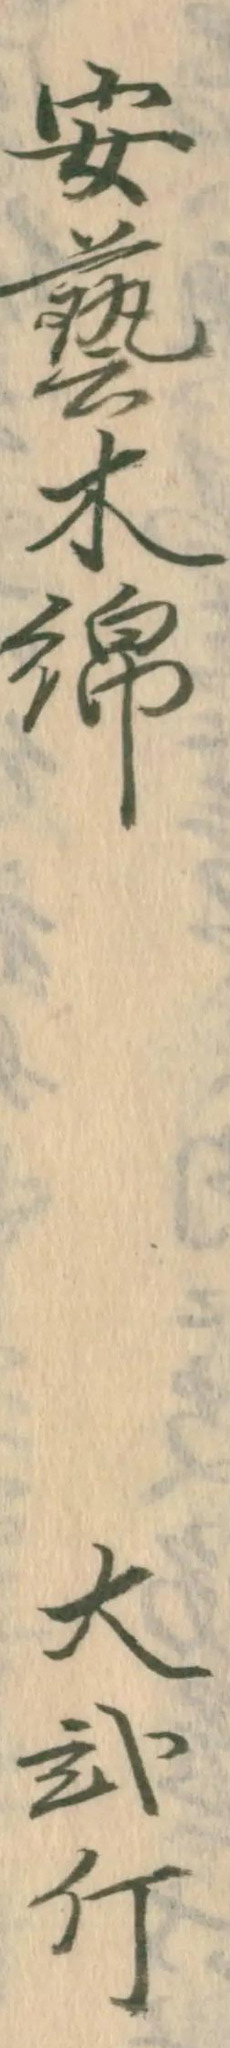安芸木綿大弐斤
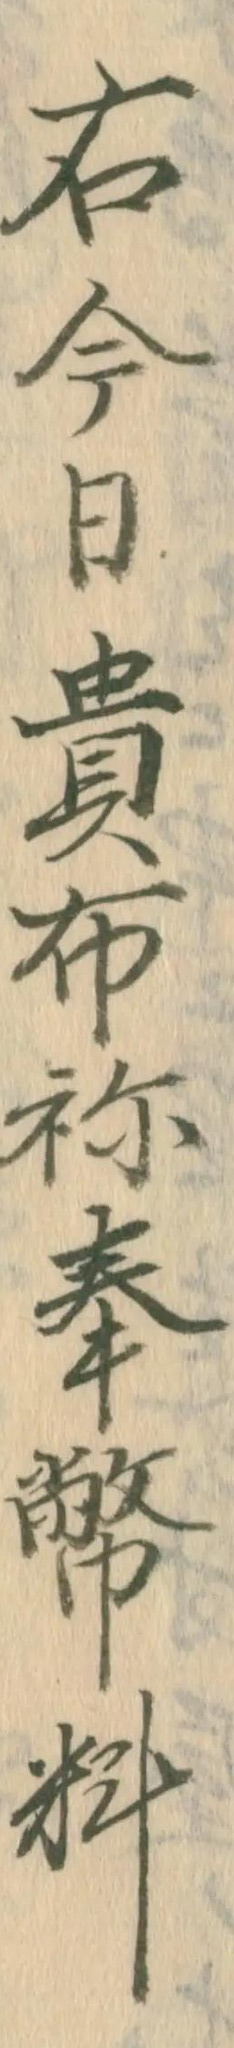右今日貴布祢奉幣料
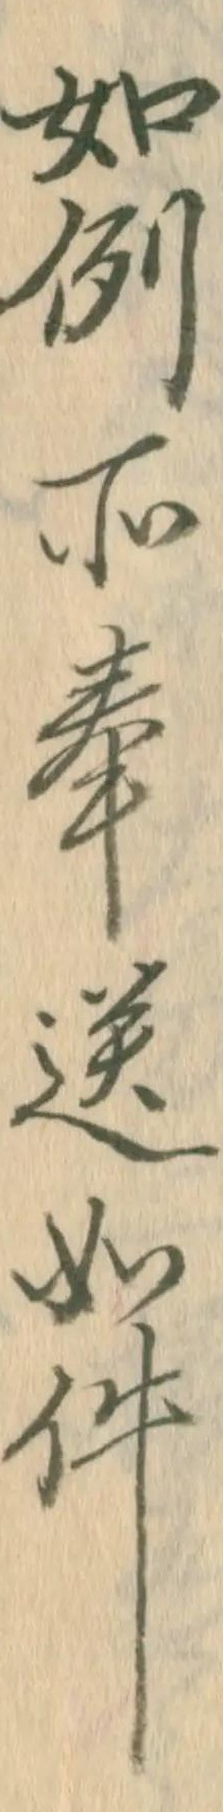如例所奉送如件
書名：賀茂社記録. 第16冊
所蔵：国立国会図書館 National Diet Library, JAPAN
